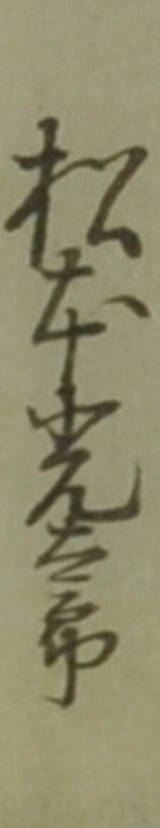松本光太郎

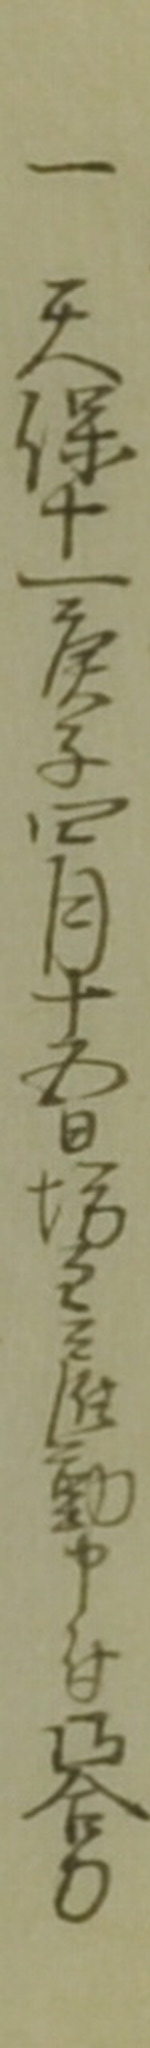一天保十一庚子四月十五日坊主雇勤申付御合力
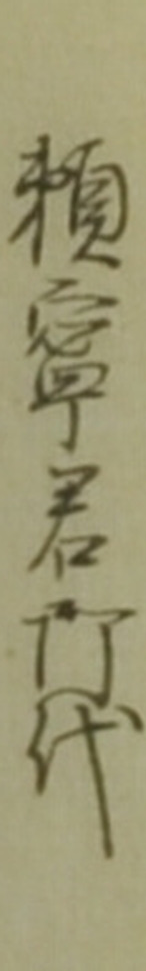頼寧君御代
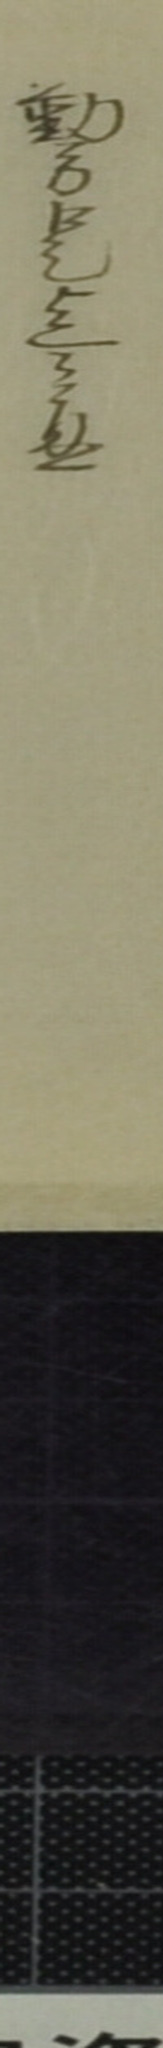勤方是迄之通
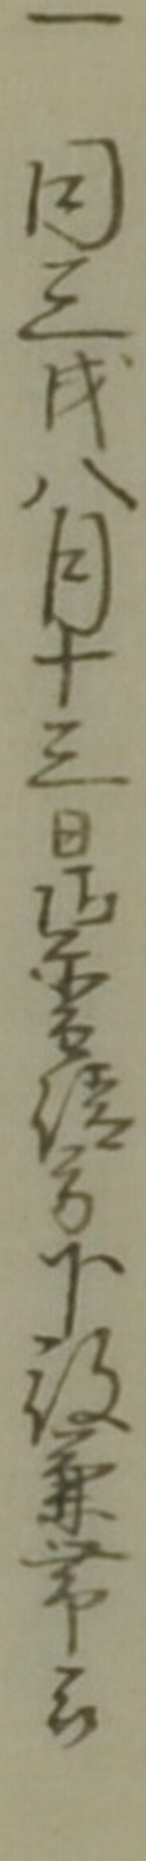一同三戌八月十三日御普請方下役兼帯被
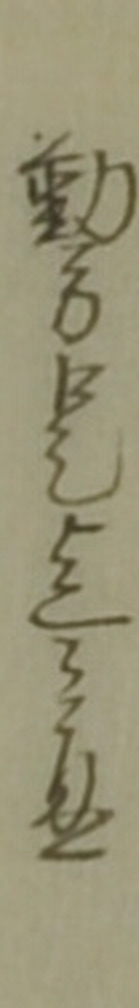勤方是迄之通
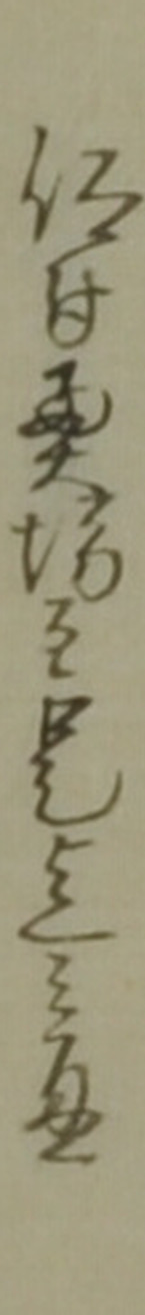仰付奥坊主是迄之通

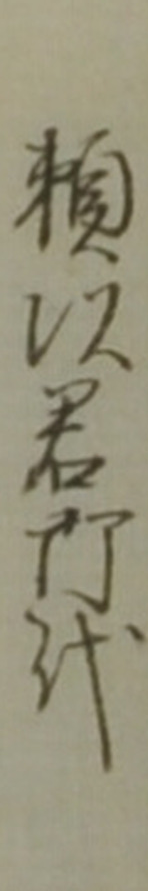頼以君御代
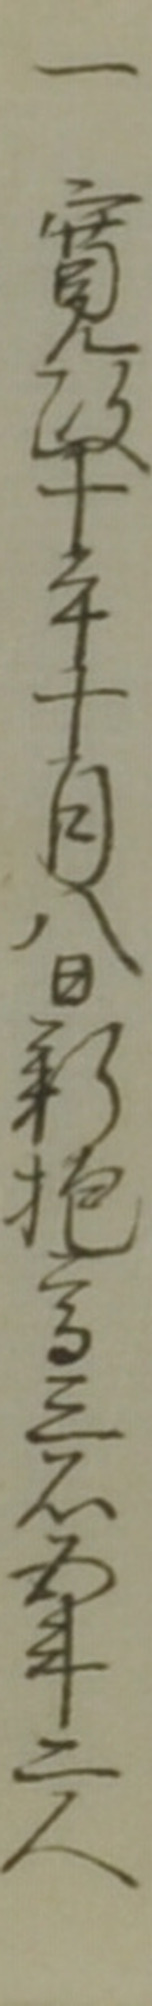一寛政十午十月八日新抱高三石五斗二人
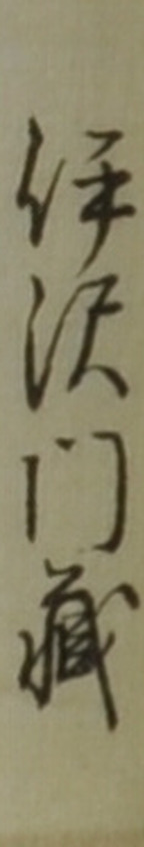伊沢門蔵
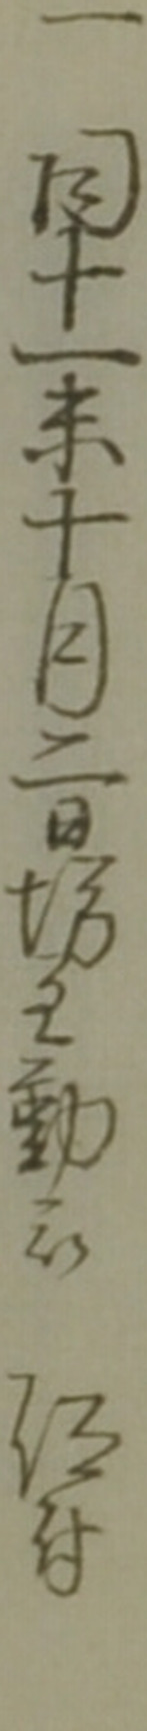一同十一未十月二日坊主勤被仰付
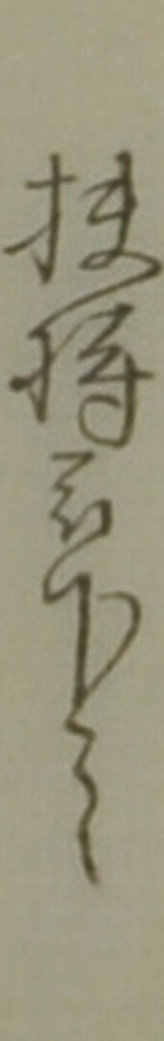扶持被下之
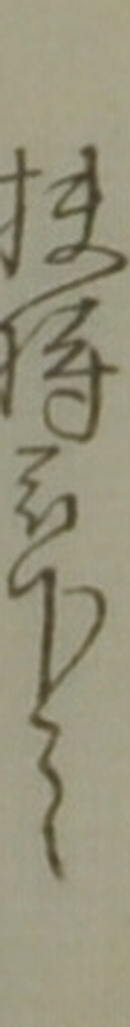扶持被下之
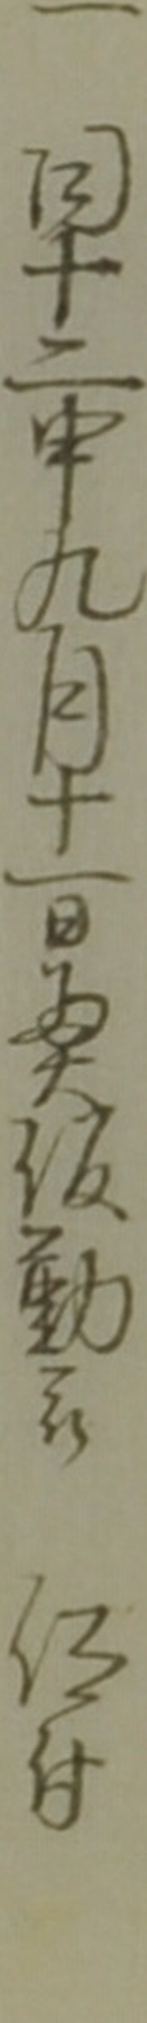一同十二申九月十一日奥仮勤被仰付
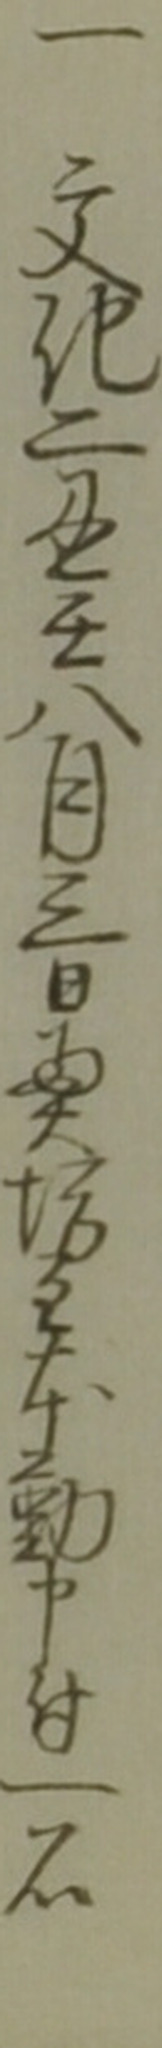一文化二丑閏八月三日奥坊主本勤申付一石
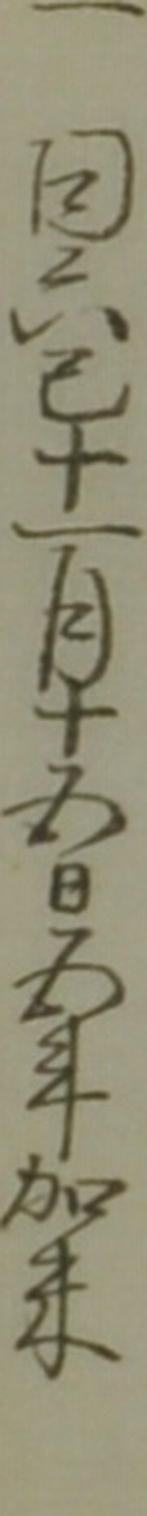一同六巳十一月十五日五斗加米
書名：無足諸士勤仕録（七）
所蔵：伊那市立高遠町図書館・合同会社AMANE
